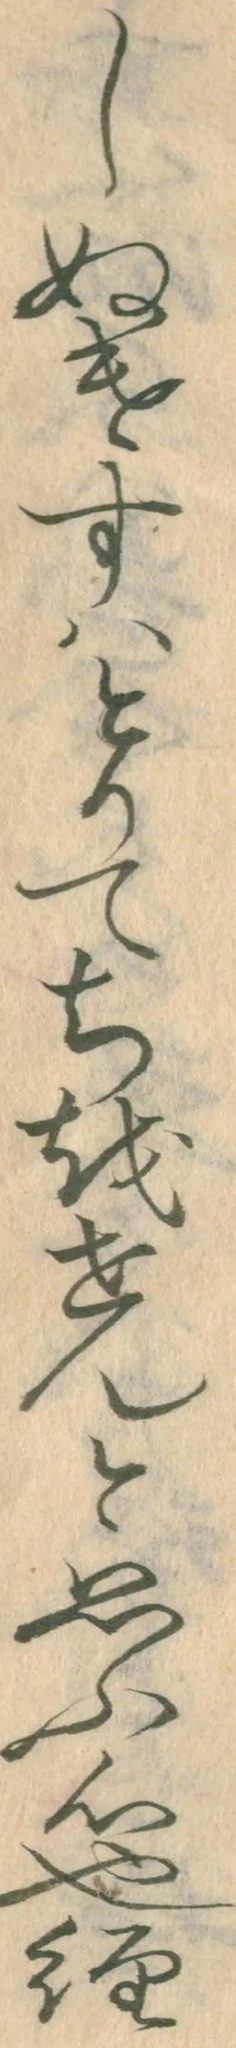しぬけすはとりてちをせんと思ふ心也経
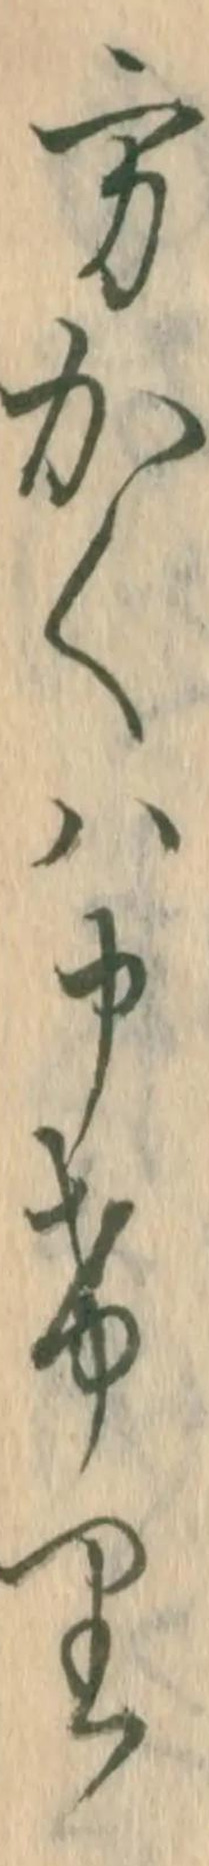方かくは申けり

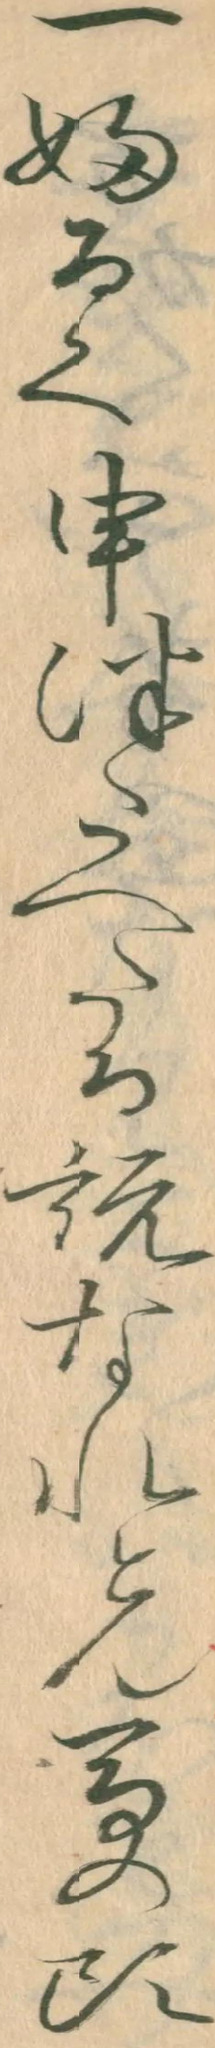一ふるく申つたへたる説なれとん馬の頭
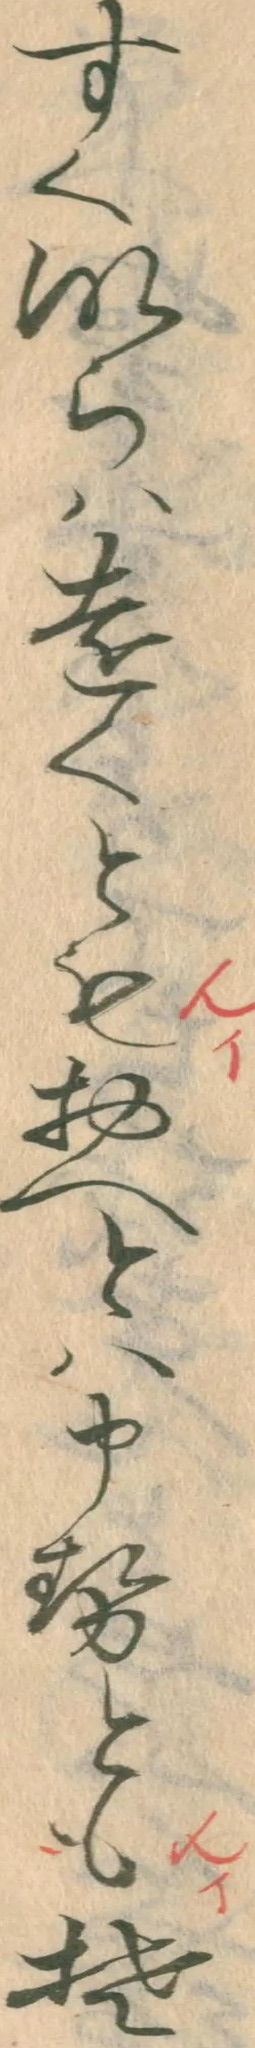すくならは遠くともおへとは申せともそ
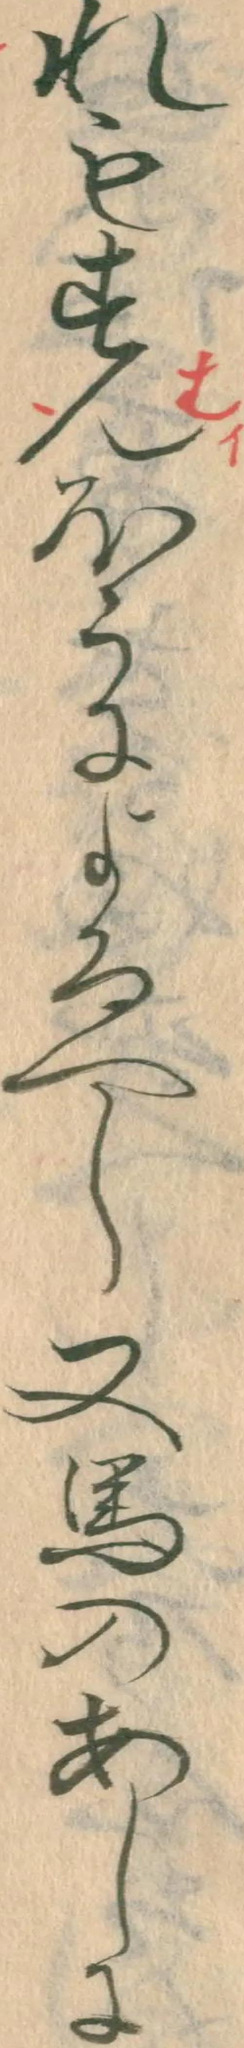れもすんほうによるへし又馬のあしに
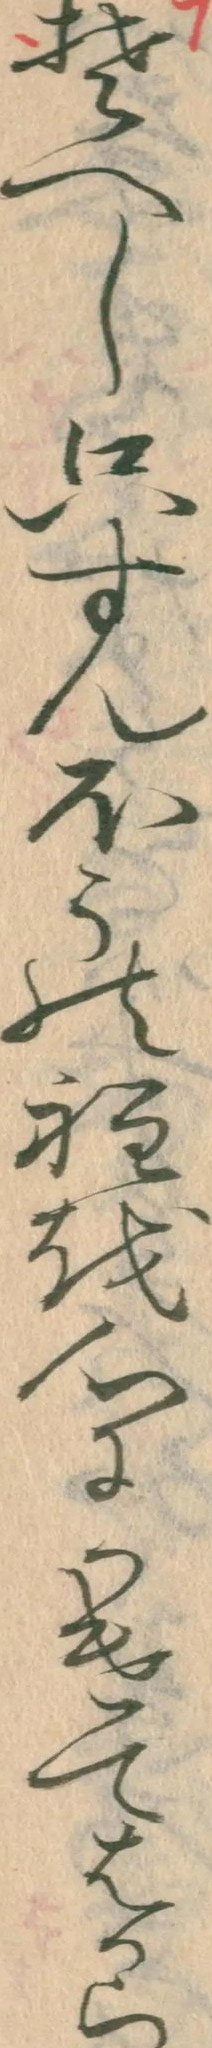そへし只すんほうの程を心にかけてはから
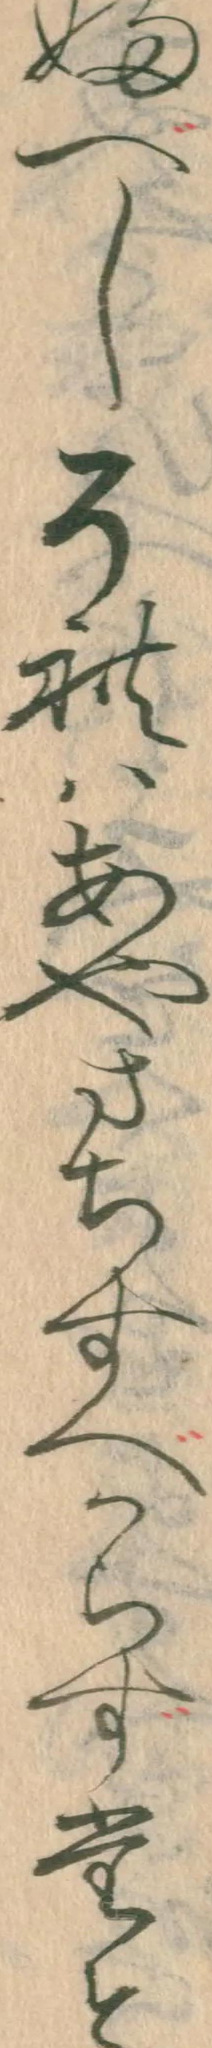ふべしそれはあやまちすべからすたと
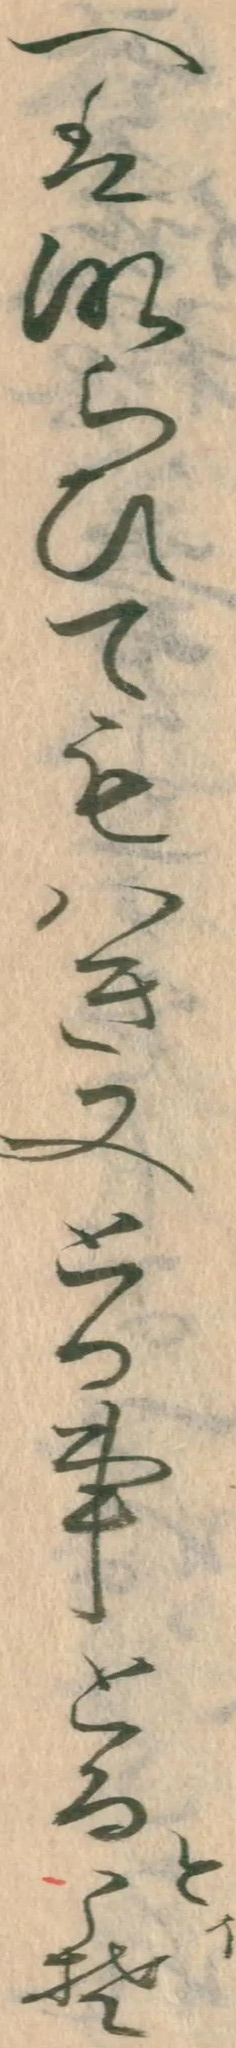へはならひてもはき又とる事とるこそ
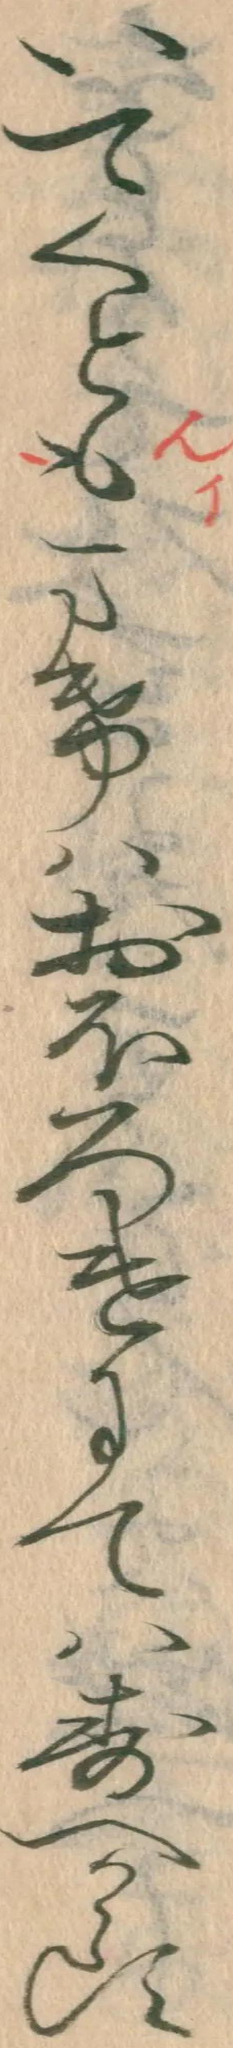いてくともまけはおほろけにてはすへからす
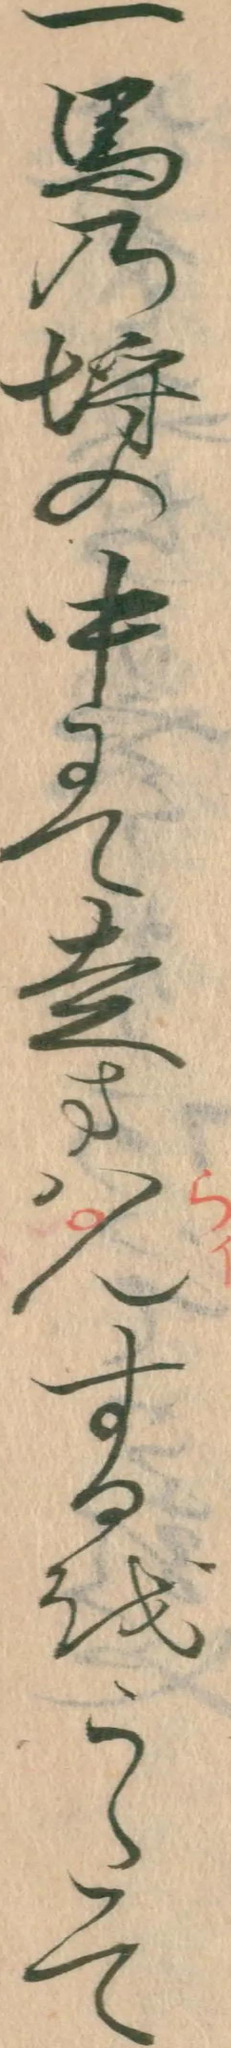一馬の埒の中にて走まは◦んするをうたて
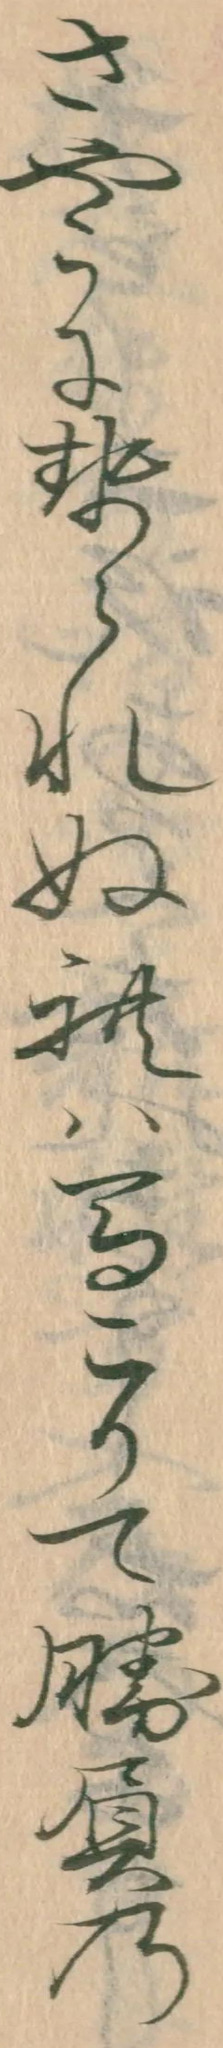さやうにせられぬれは馬こりて勝負の
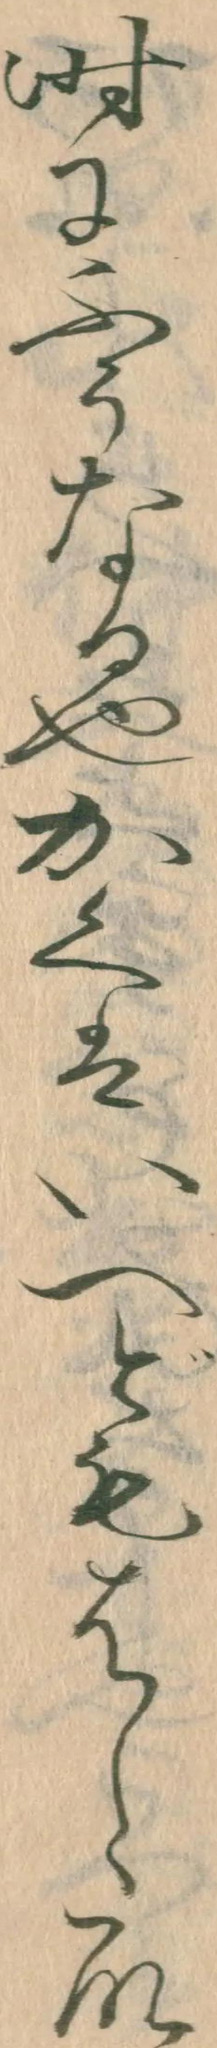時にふうなる也かくはいへどもはしたな
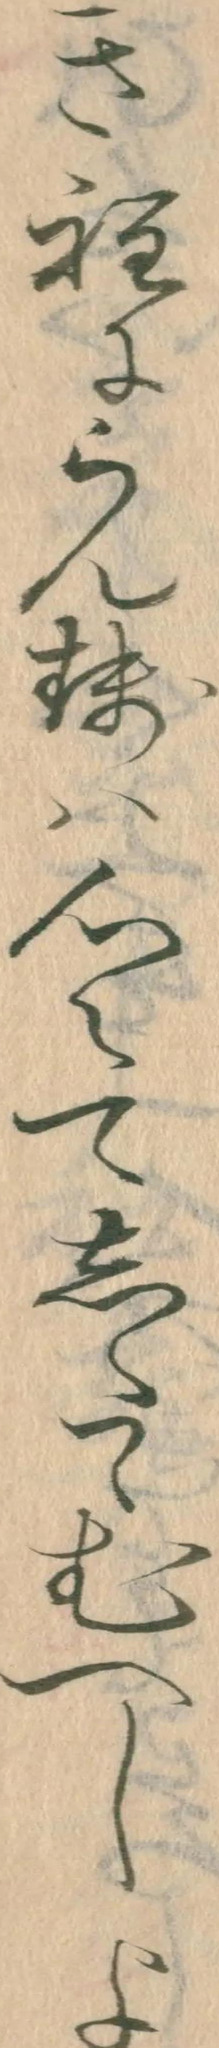き程にらんせは心えてしたゝむへしよ
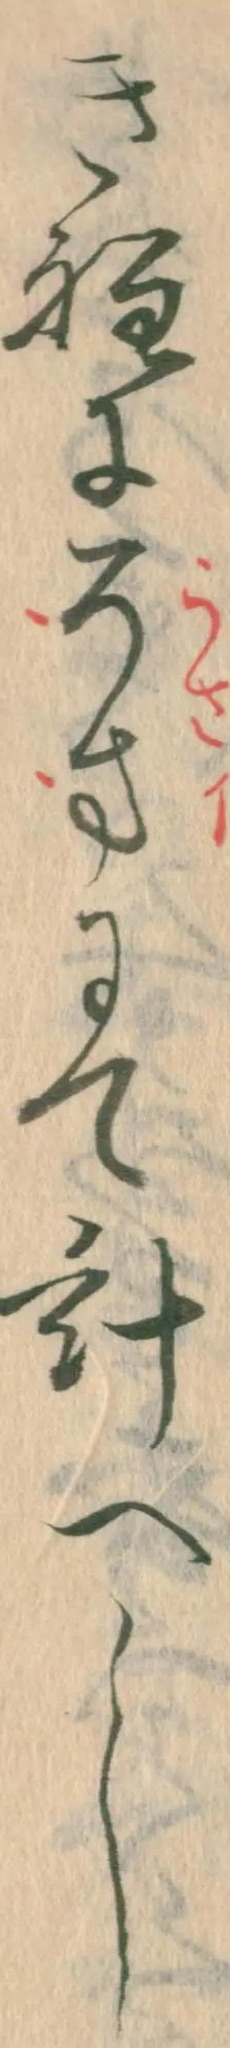き程にそまにて計へし
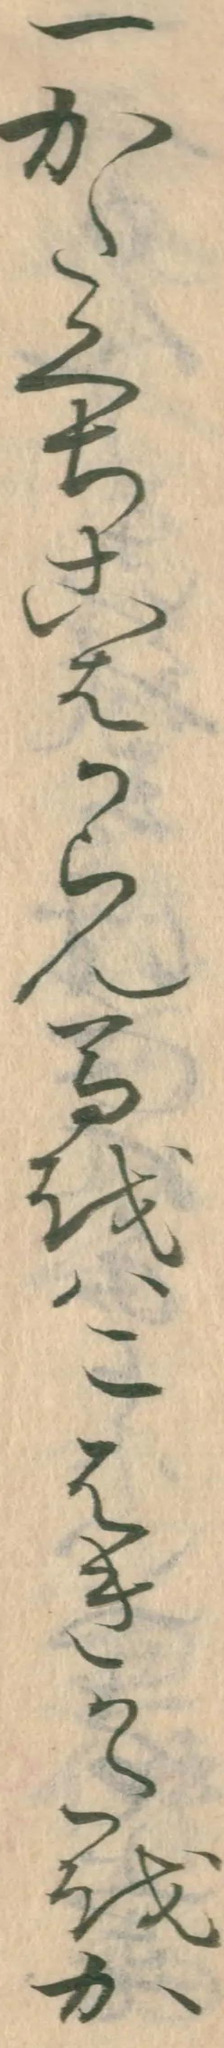一かたくちこはからん馬をはこはきかたをか
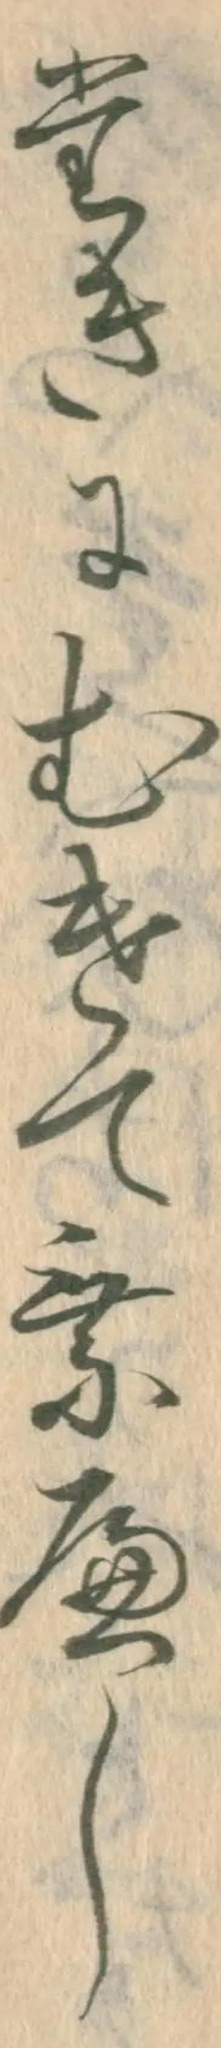たきにむけて乗へし
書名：賀茂社記録. 第13冊
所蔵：国立国会図書館 National Diet Library, JAPAN
